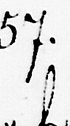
1.
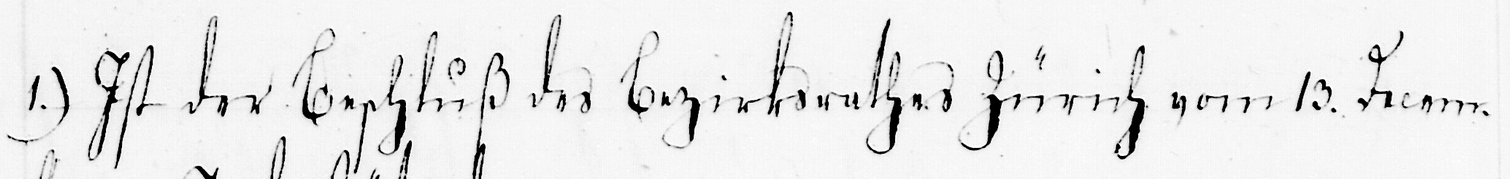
1.) Ist der Beschluß des Bezirksrathes Zürich vom 13. Decem¬
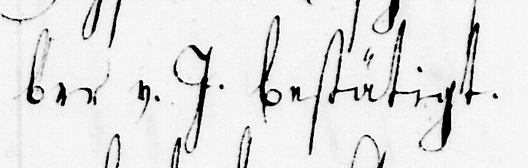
ber v. J. bestätigt.
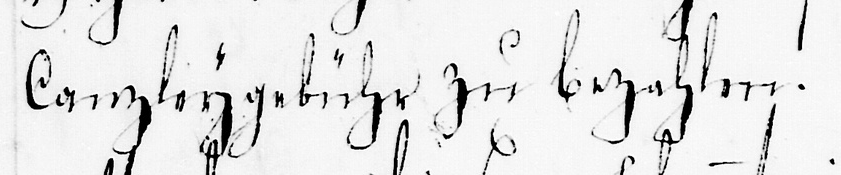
Canzleygebühr zu bezahlen.
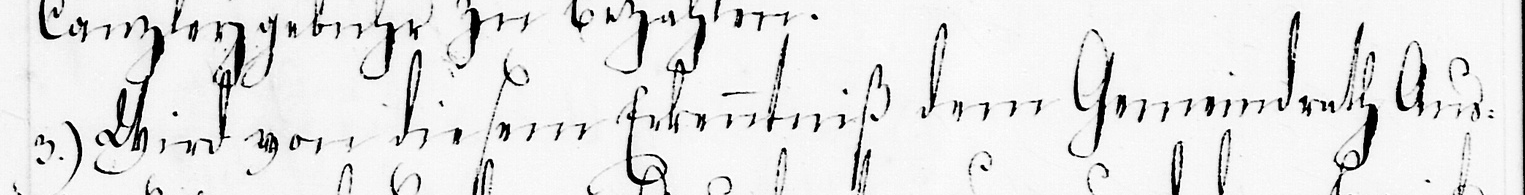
3.) Wird von diesem Erkenntniß dem Gemeindrath Au¬
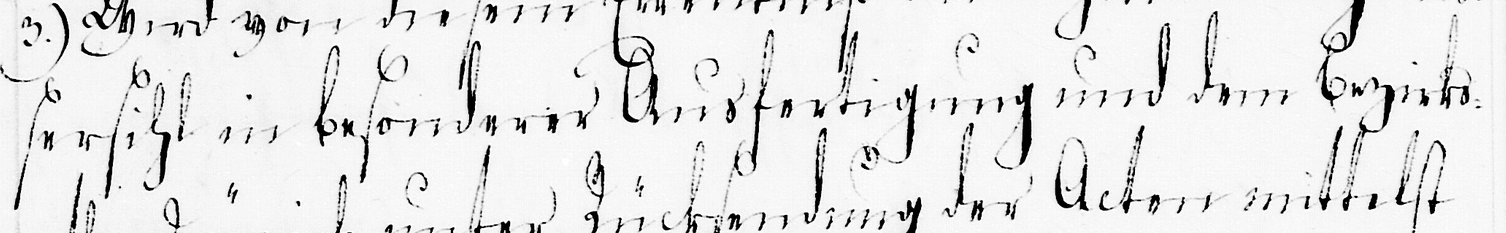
ßersihl in besonderer Ausfertigung und dem Bezirks¬
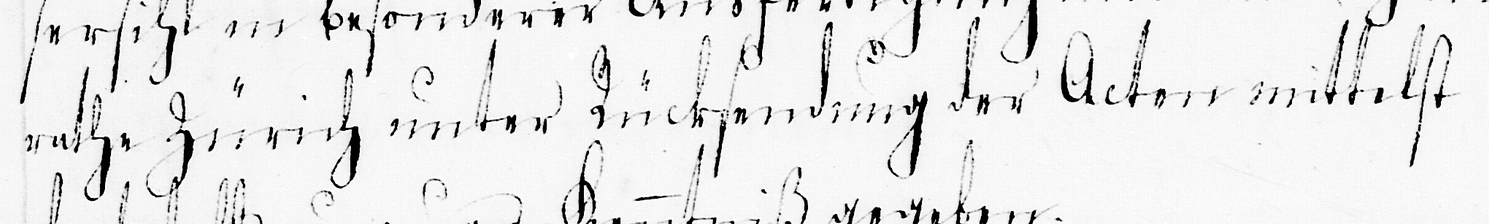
rathe Zürich unter Rücksendung der Acten mittelst
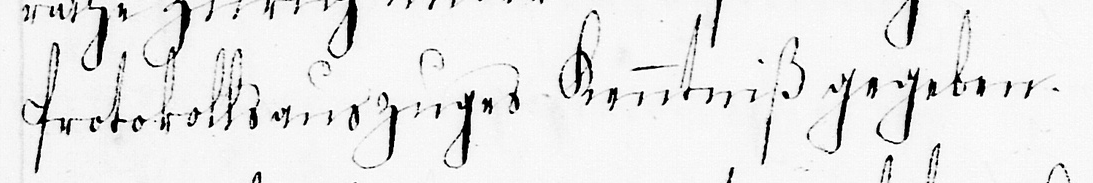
Protokollsauszuges Kenntniß gegeben.
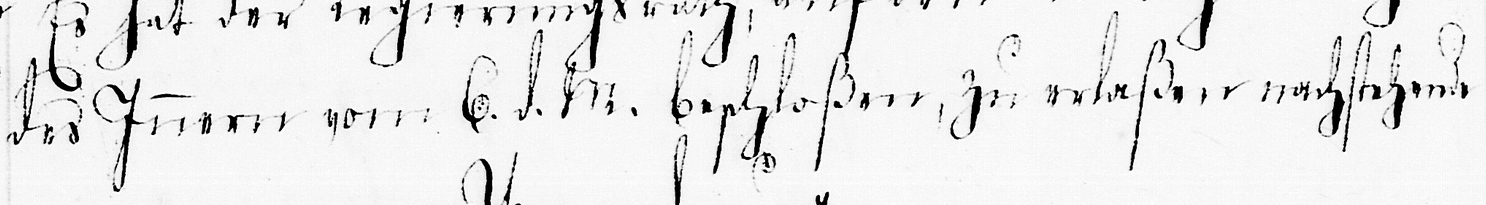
des Innern vom 6. d. M. beschloßen, zu erlaßen nachstehende
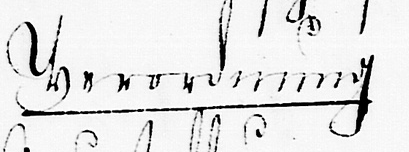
Verordnung
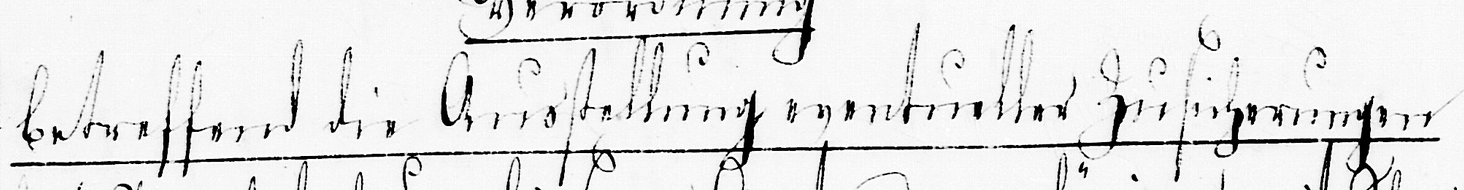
betreffend die Ausstellung eventueller Zusicherungen
